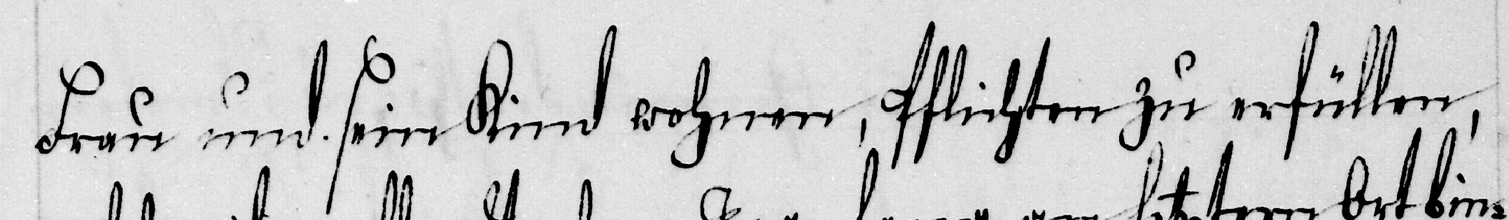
Frau und sein Kind wohnen, Pflichten zu erfüllen,
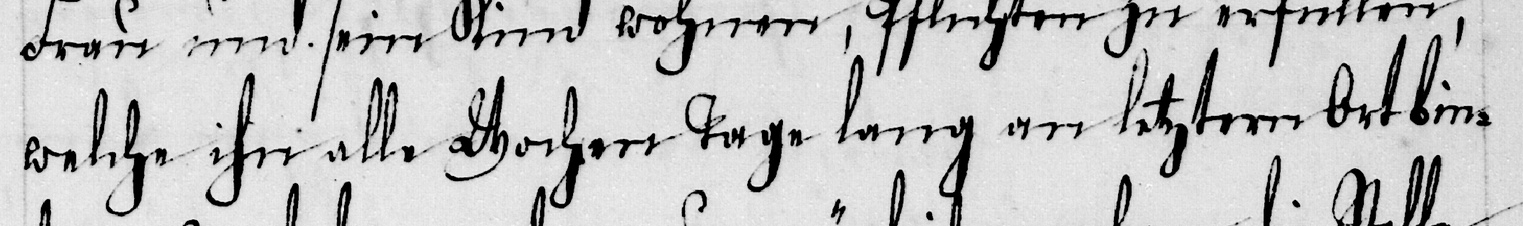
welche ihn alle Wochen Tage lang an letztern Ort bin¬
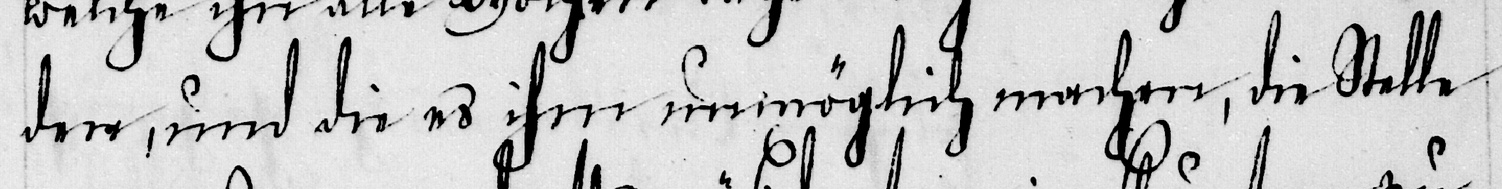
den, und die es ihm unmöglich machen, die Stelle
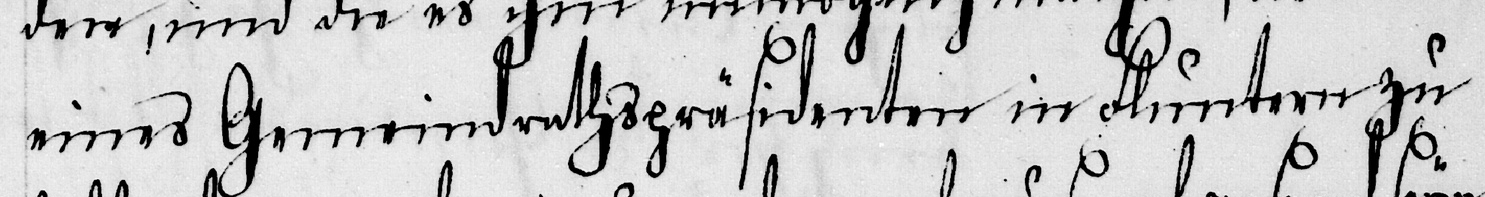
eines Gemeindrathspräsidenten in Fluntern zu
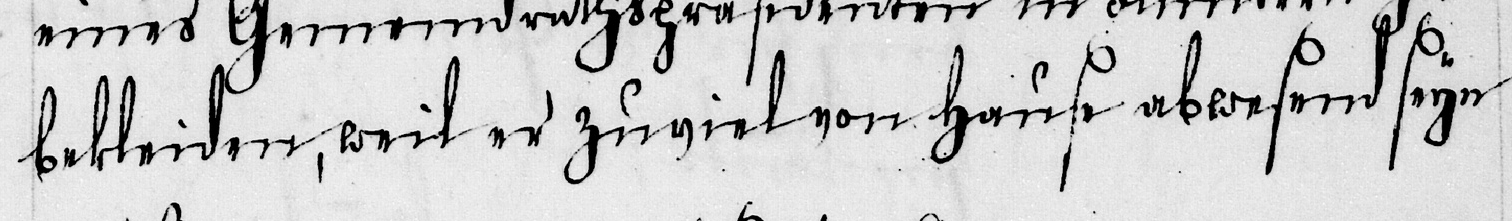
bekleiden, weil er zu viel von Hause abwesend sey
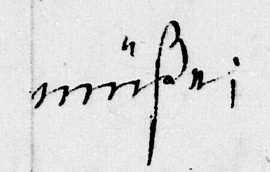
müße;
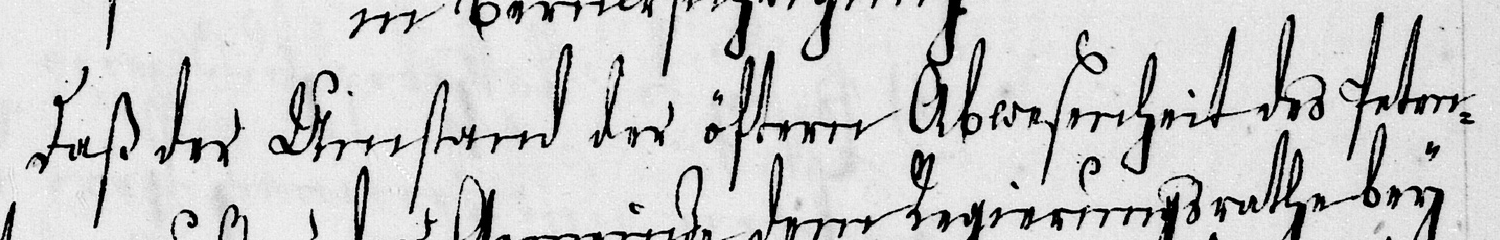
Daß der Umstand der öftern Abwesenheit des Peten¬
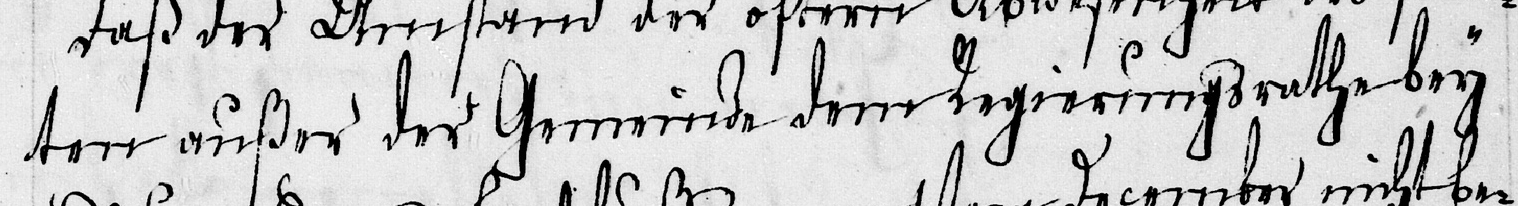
ten außer der Gemeinde dem Regierungsrathe bey
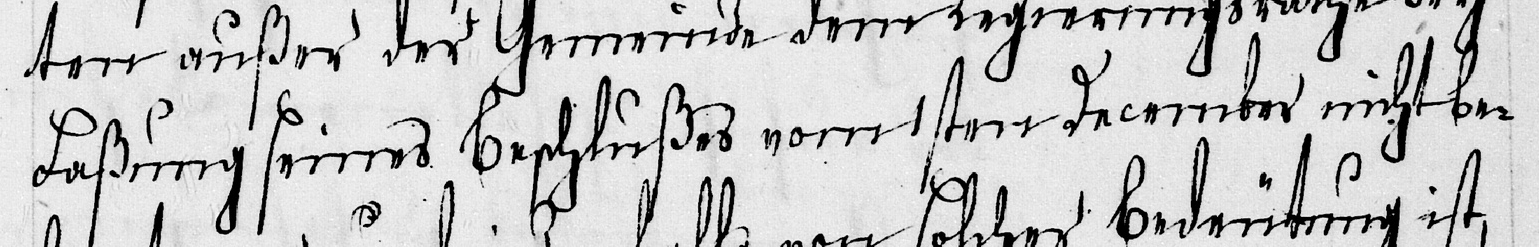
Faßung seines Beschlußes von 1sten December nicht be¬
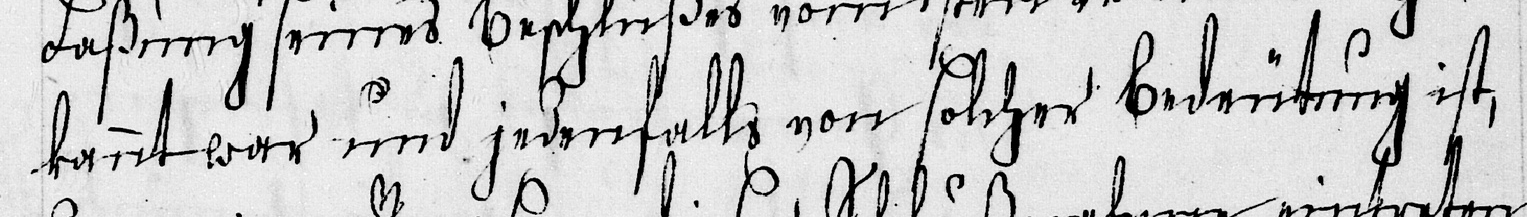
kannt war und jedenfalls von solcher Bedeutung ist,
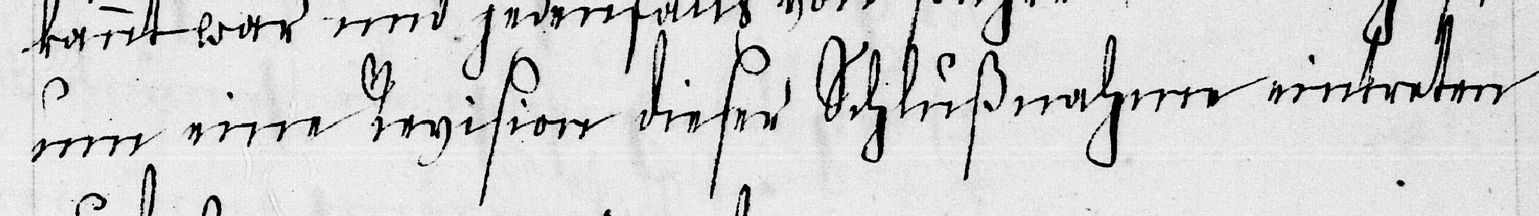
um eine Revision dieser Schlußnahme eintreten
